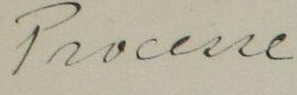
Processe
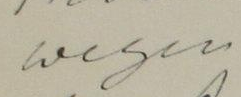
wegen
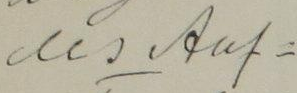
des Auf
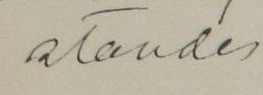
standes
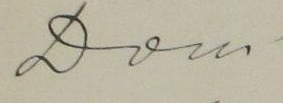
Dom
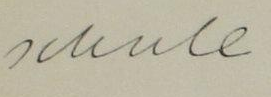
schule
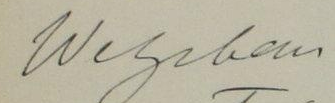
Wegebau
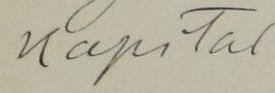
kapital
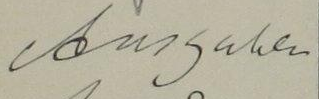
Ausgaben
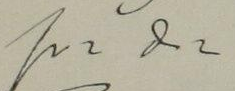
für die
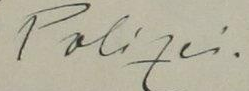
Polizei
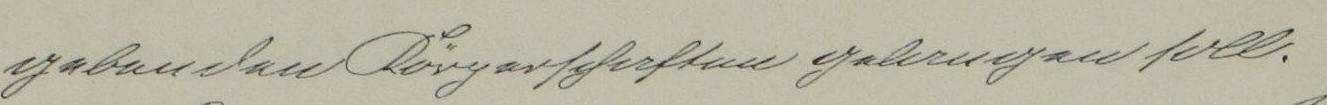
gebenden Körperschaften gelangen soll.
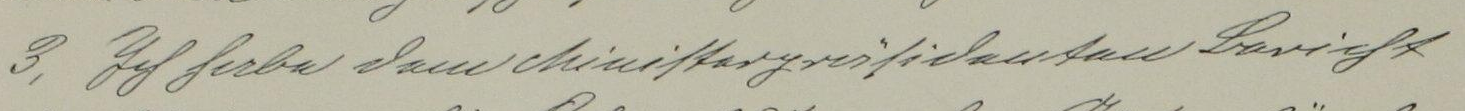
3. Ich habe dem Ministerpräsidenten Bericht
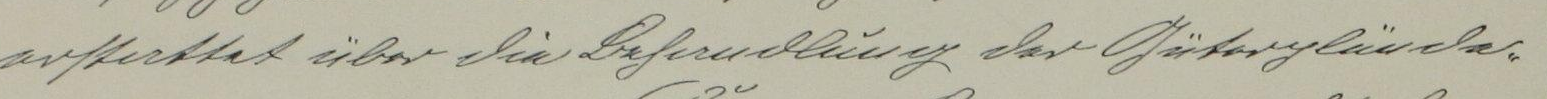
erstattet über die Behandlung der Güterplünde-
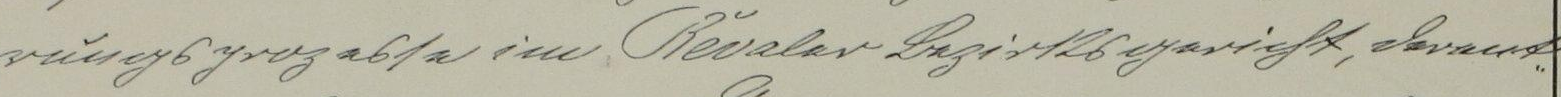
rungsprozesse im Revaler Bezirksgericht, derent-
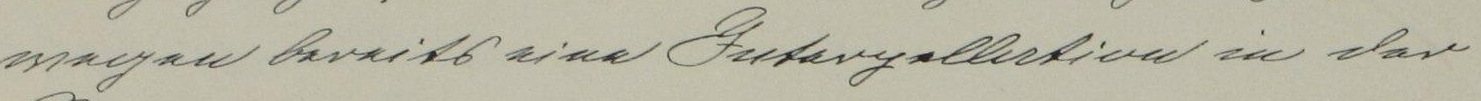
wegen bereits eine Interpellation in der
